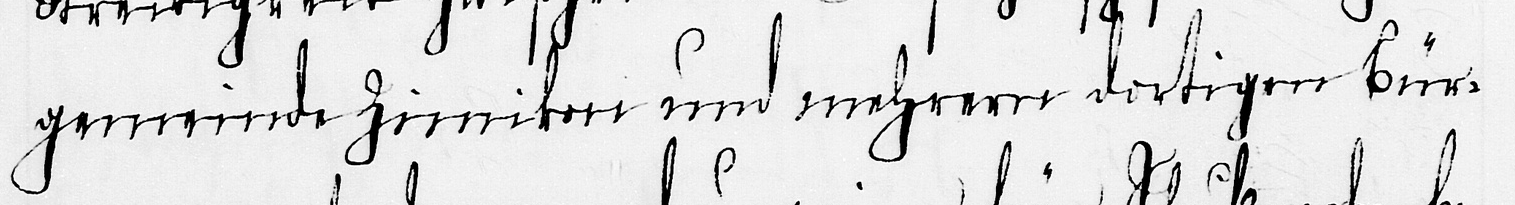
gemeinde Zimikon und mehrern dortigen Bür¬
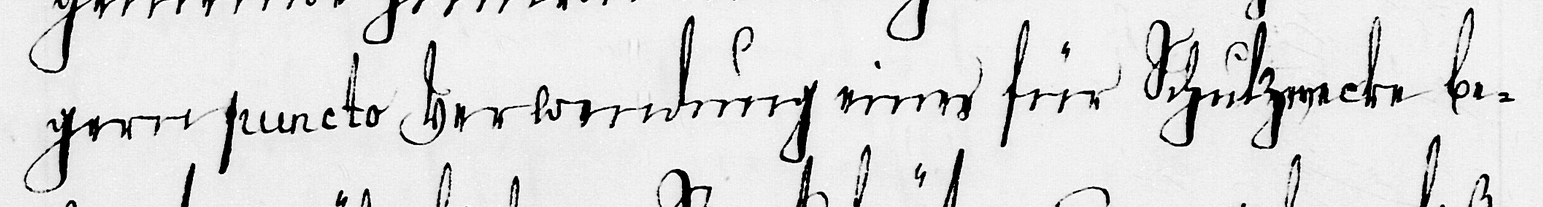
gern puncto Verwendung eines für Schulzwecke be¬
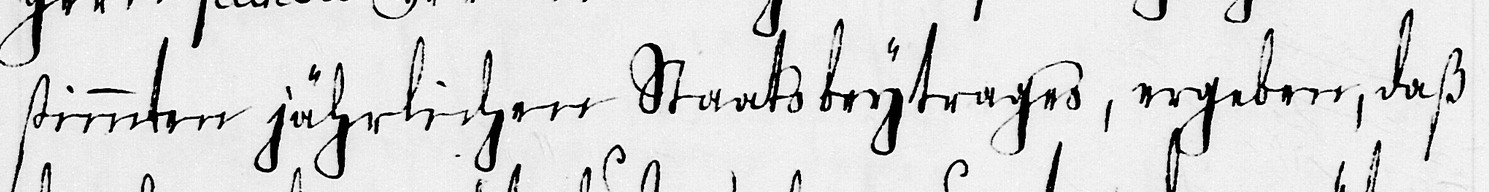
stimmten jährlichen Staatsbeytrages, ergeben, daß
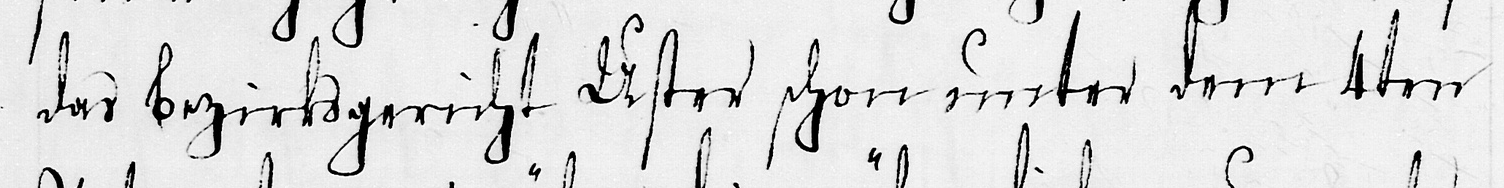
das Bezirksgericht Uster schon unter dem 4ten
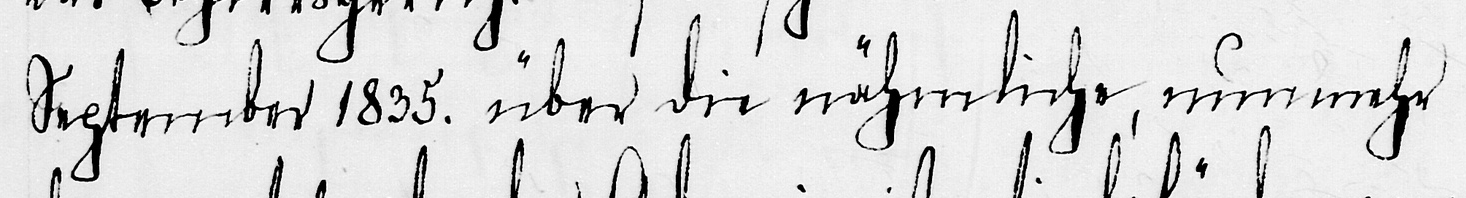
September 1835. über die nähmliche, nunmehr
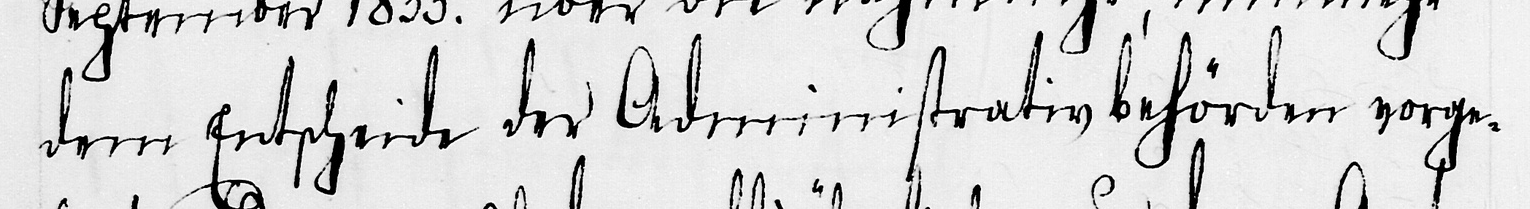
dem Entscheide der Administrativbehörden vorge¬
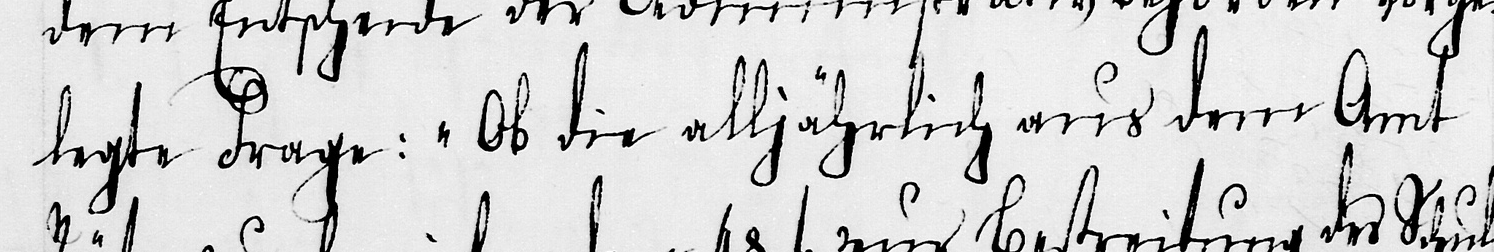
legte Frage: „Ob die alljährlich aus dem Amt
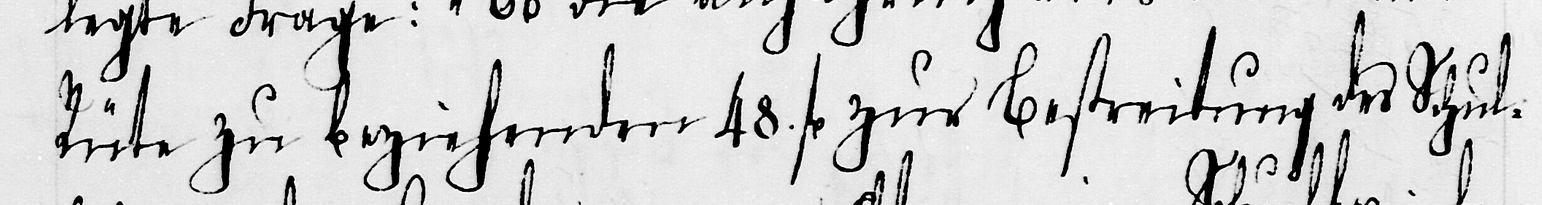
Rüte zu beziehenden 48. fl zur Bestreitung des Schul¬
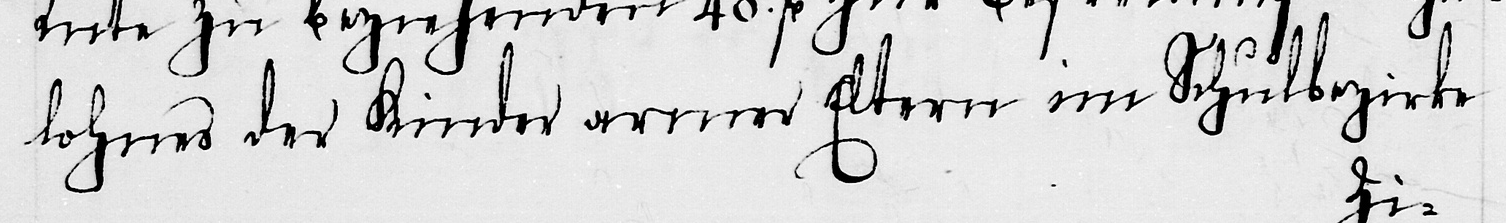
lohnes der Kinder armer Eltern im Schulbezirke
